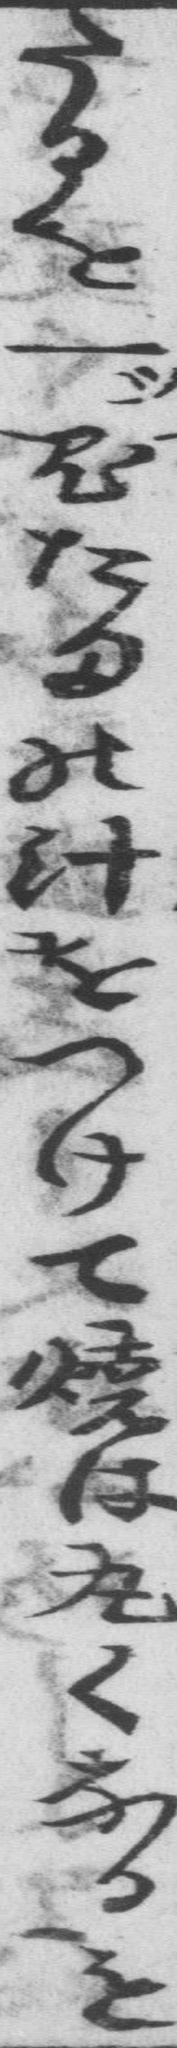たるを一ツ宛たまの汁をつけて焼は。丸くなるも
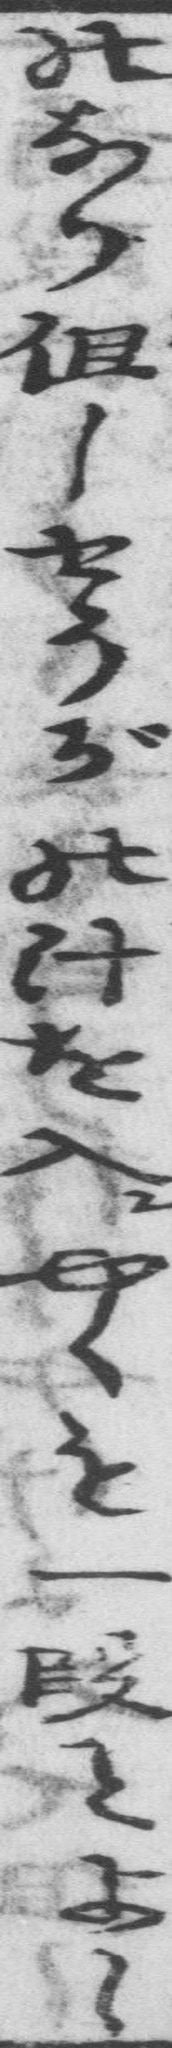のなり但しせうがの汁を入れやくも。一段とよし。
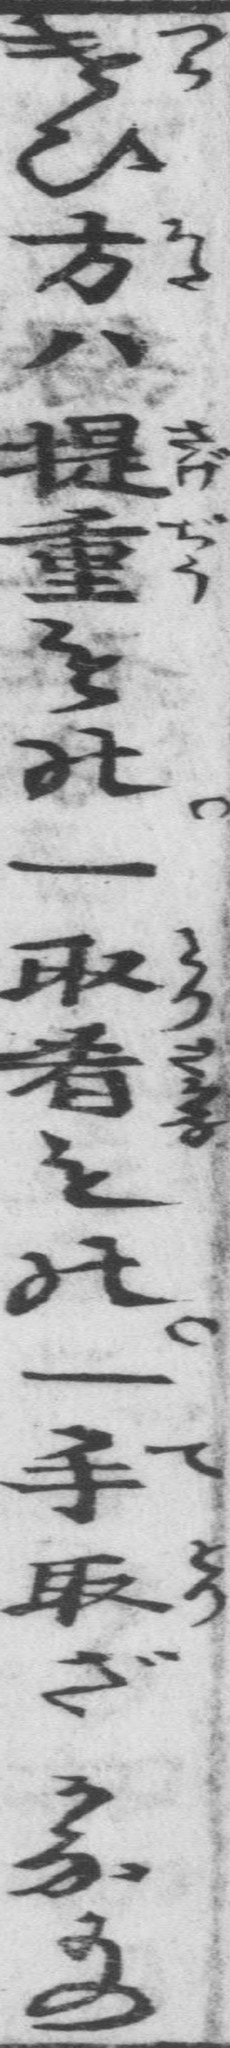遣ひ方は提重もの。一取肴もの。一手取ざかなもの
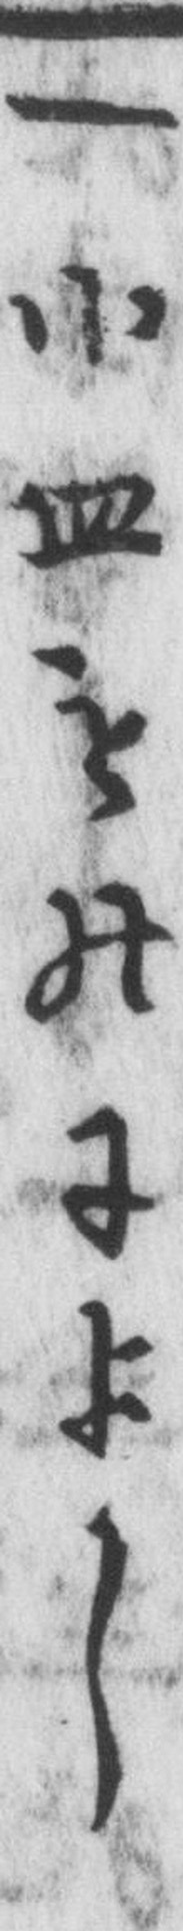一小皿ものによし
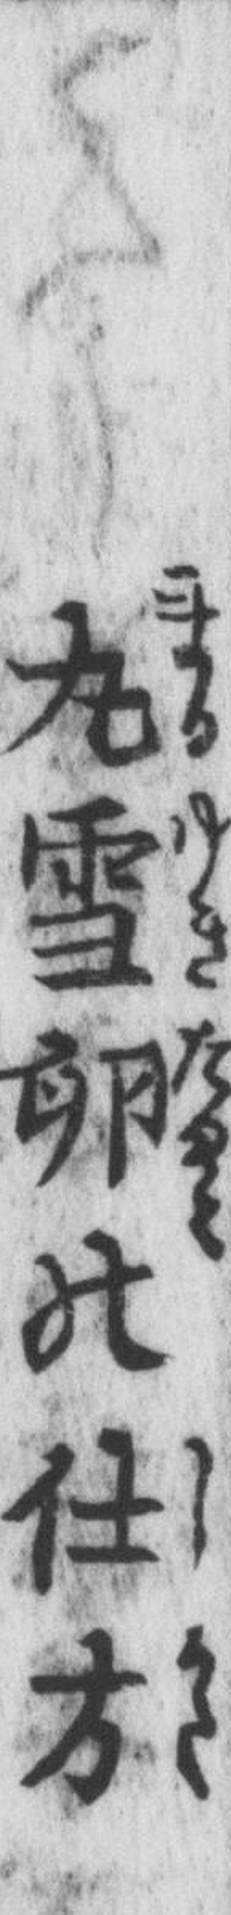丸雪卵の仕方
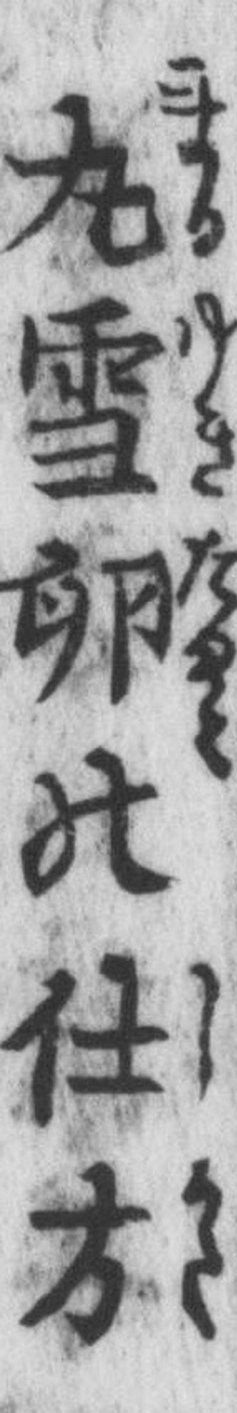丸雪卵の仕方
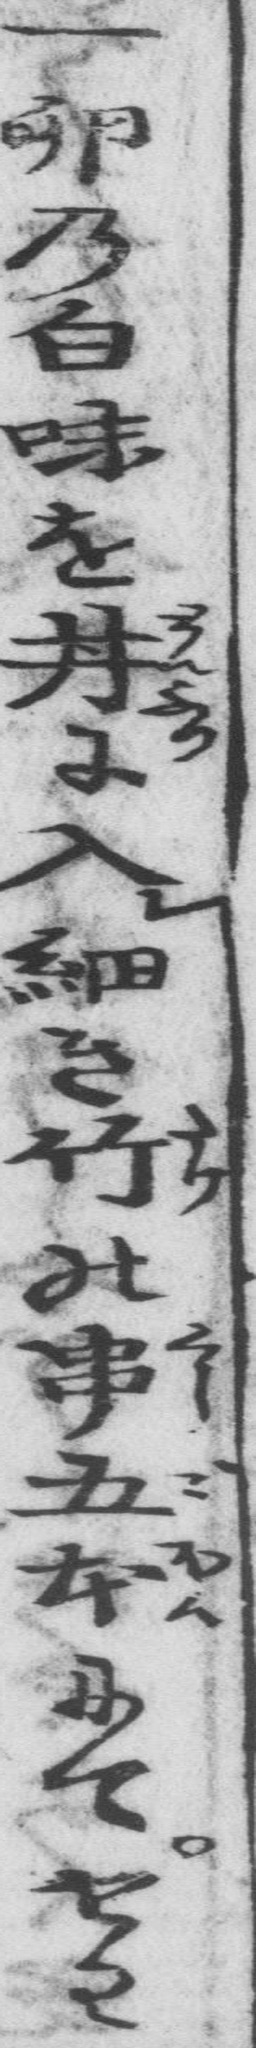一卵の白味を丼に入れ細き竹の串五本にて。せわ
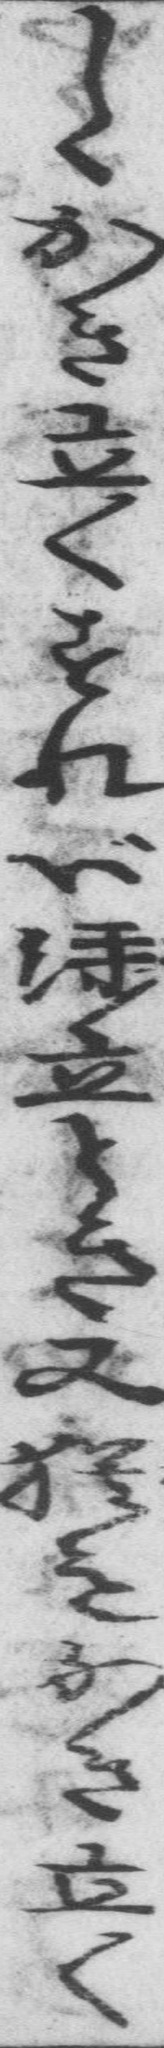しくかき立〳〵すれば沫立とき。又猶もかき立〳〵
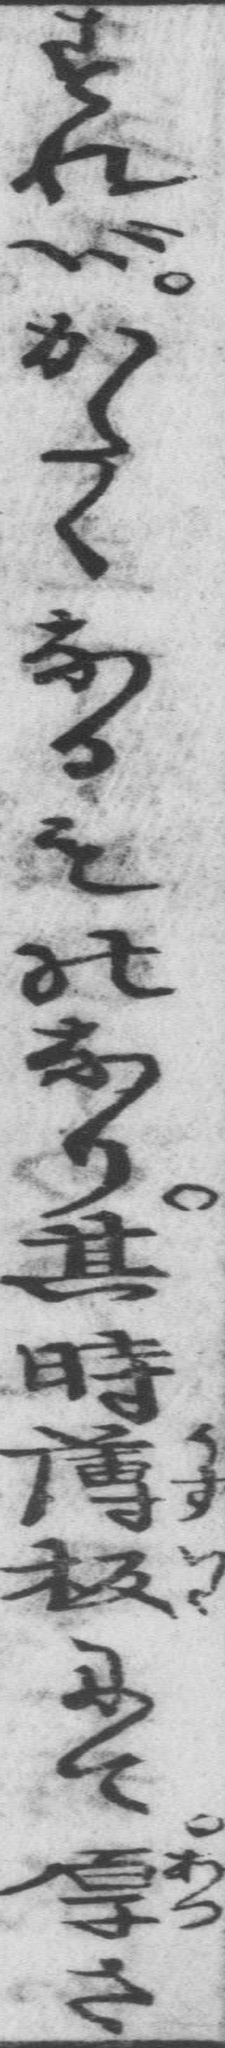すれば。かたくなるものなり。其時薄板にて。厚さ
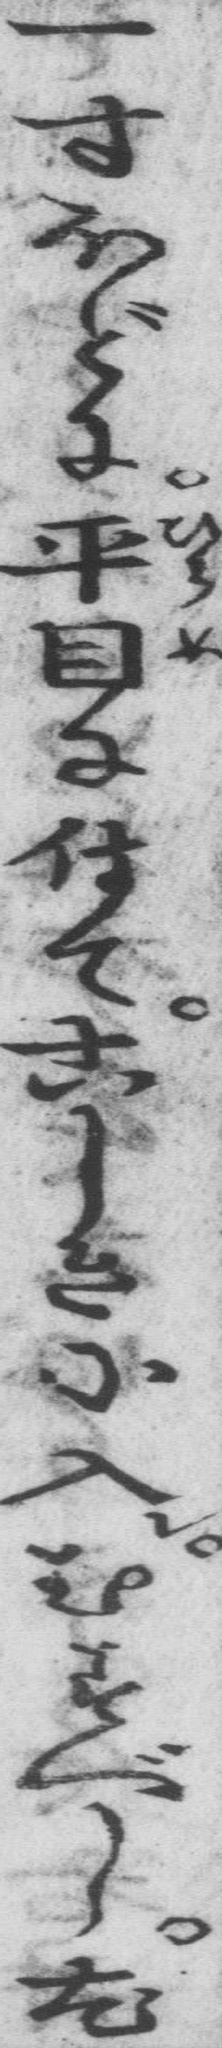一寸ほどに。平目に付て。こしきに入れ。むすべし。尤

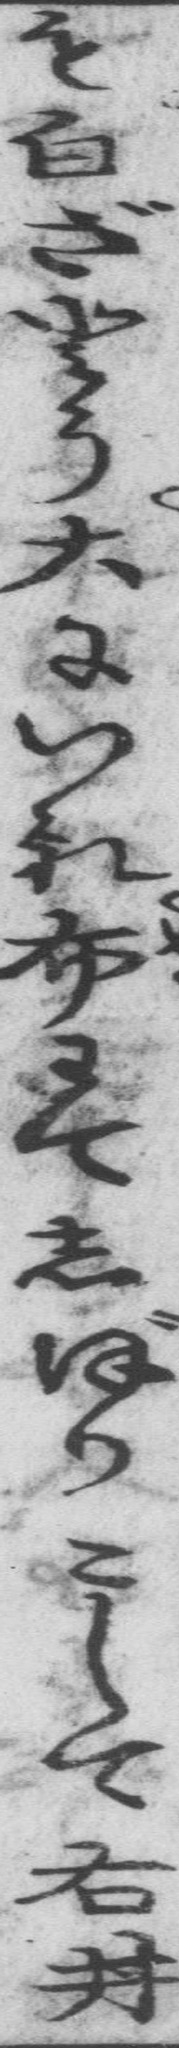も。白ざとう。大にいれ。布にてしぼりこして。右丼
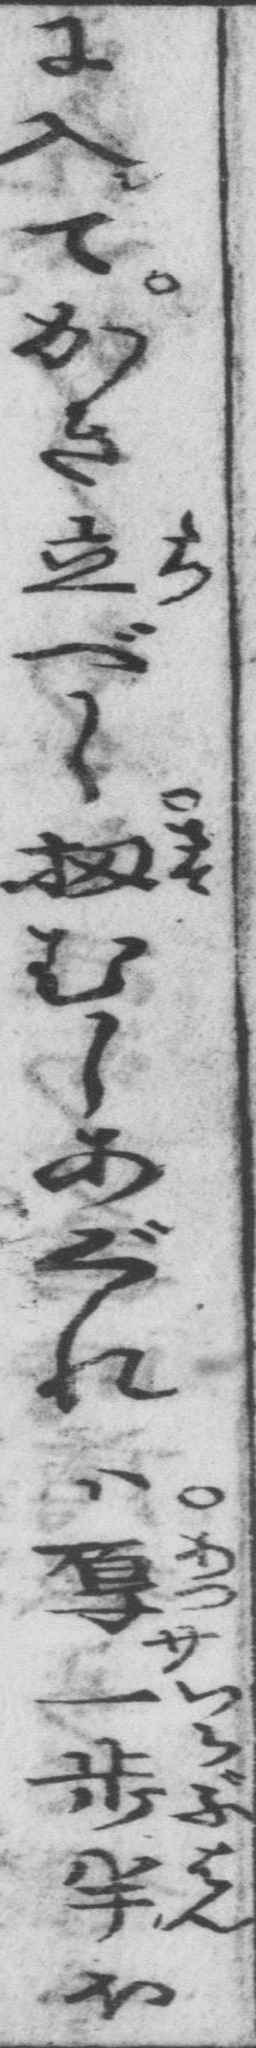に入れて。かき立べし。扨むしあぐれは。厚さ一歩半ほ
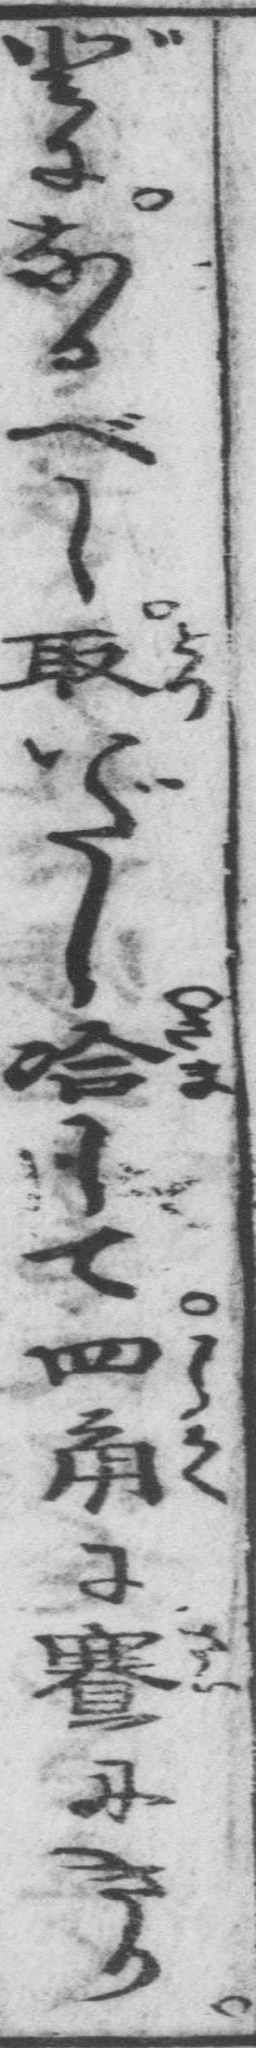どに。なるべし。取いだし。冷して。四角に賽にきり。
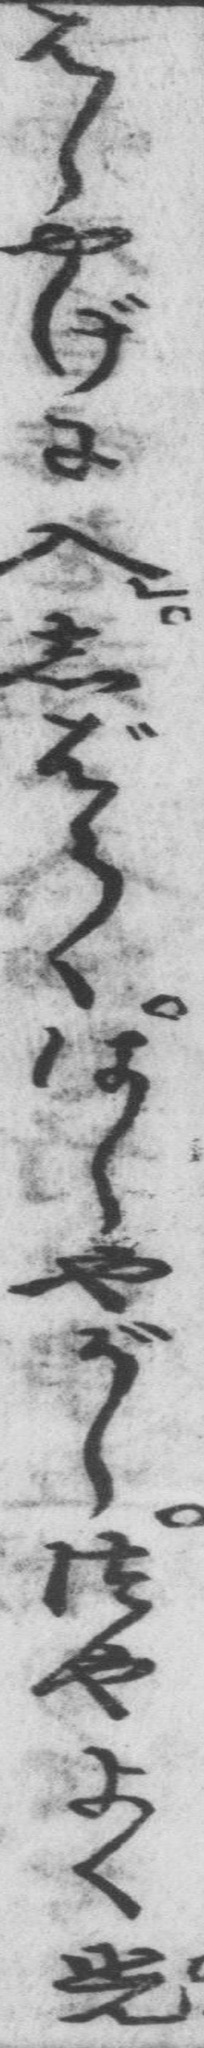はしやげに入れ。しばらく。はしやがし。つやよく光
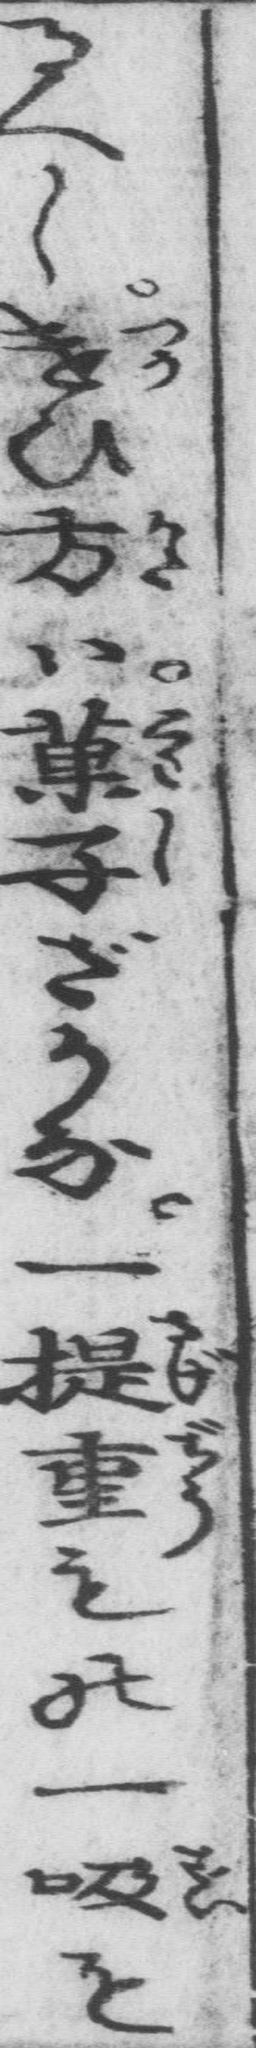るへし。遣ひ方は。菓子ざかな。一提重もの一吸も
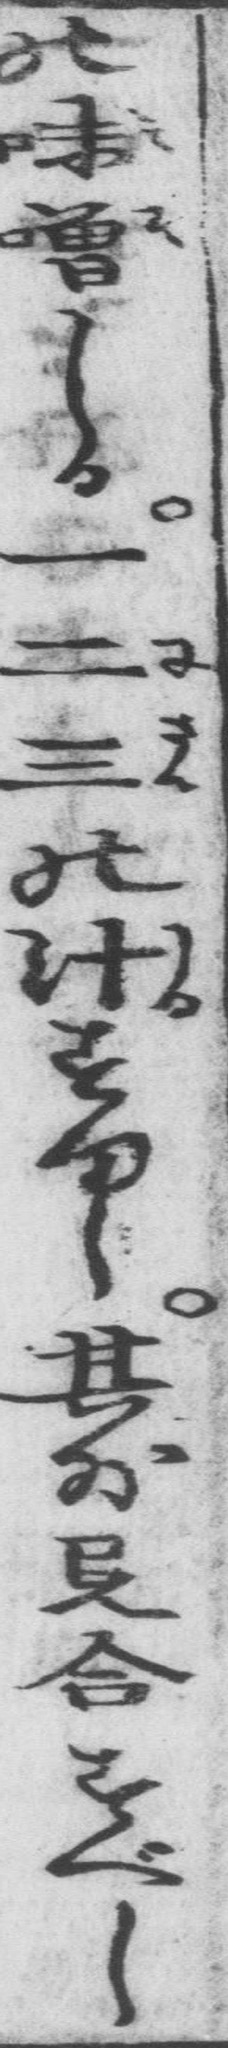の味噌しる。一二三の汁すまし。其外見合すべし
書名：萬寳料理秘密箱
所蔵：大阪府立大学学術情報センター 国文学研究資料館
